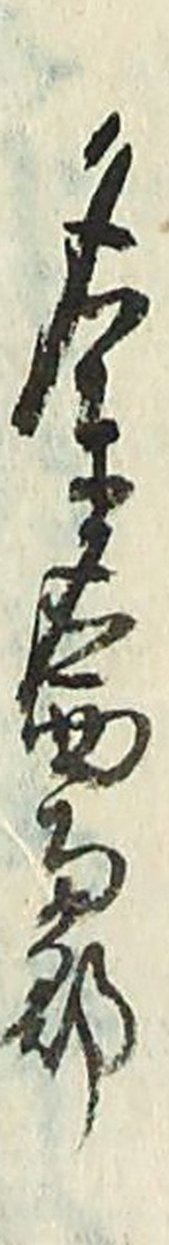名東名西両郡
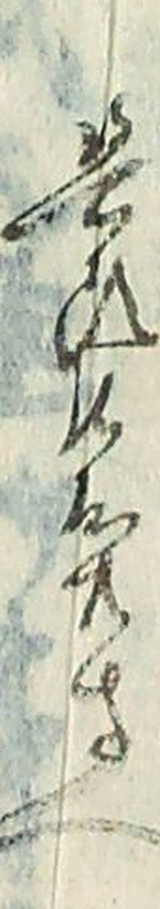与頭庄屋共方へ
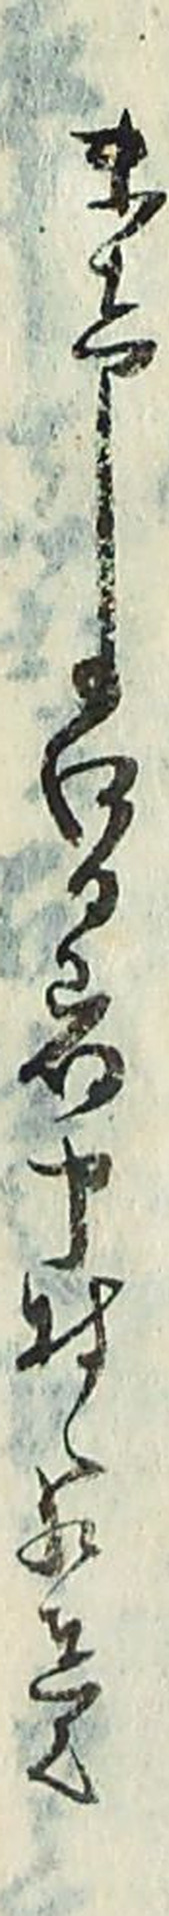未十一月四日着中村へ相達候
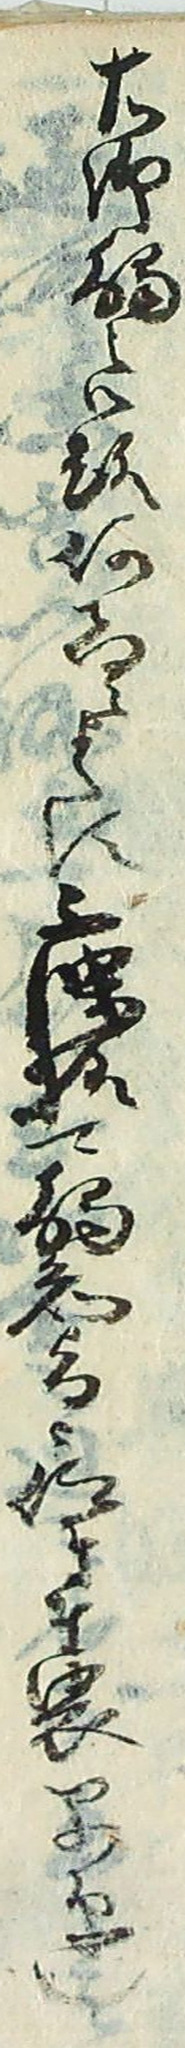右御触之御趣何者によらす不洩様可触知旨被仰付奉畏早速
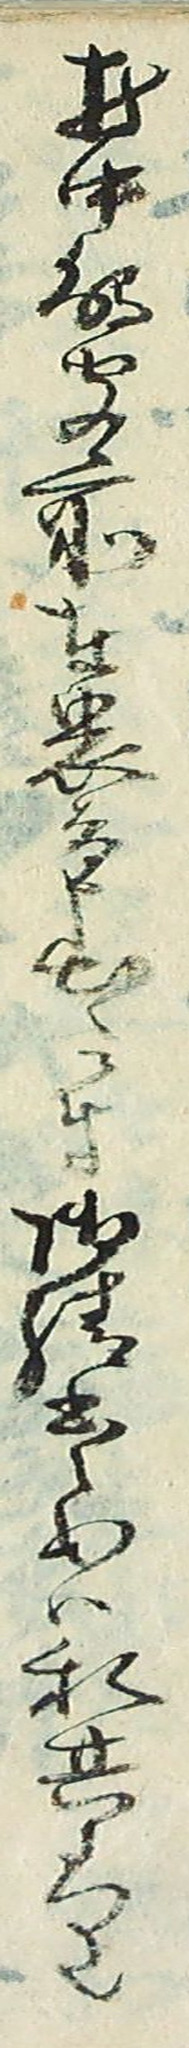村中触聞候所奉畏旨申出候に付御請書之義は私共より
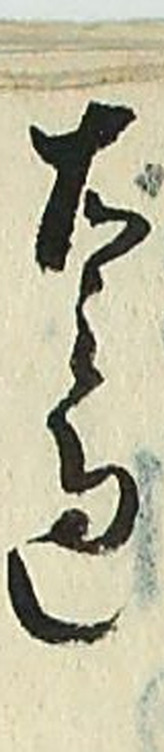右之通
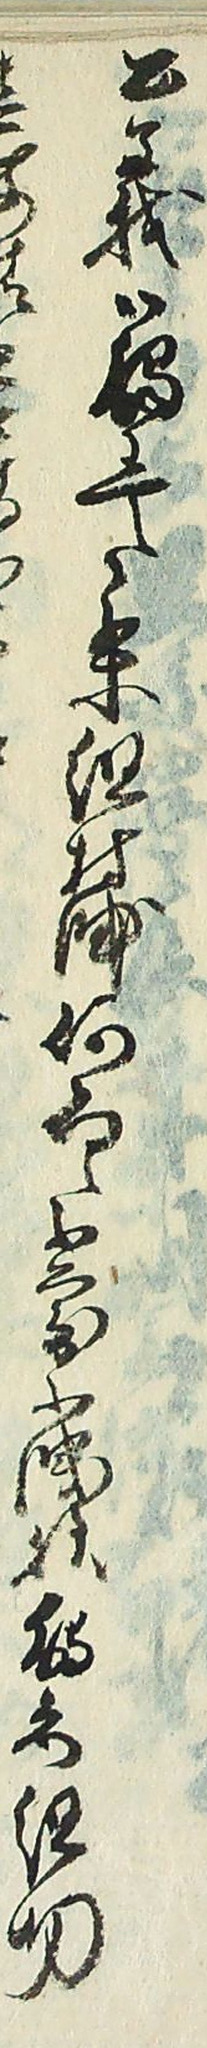公義御触有之候条組村浦何者に不寄不洩様触知組切
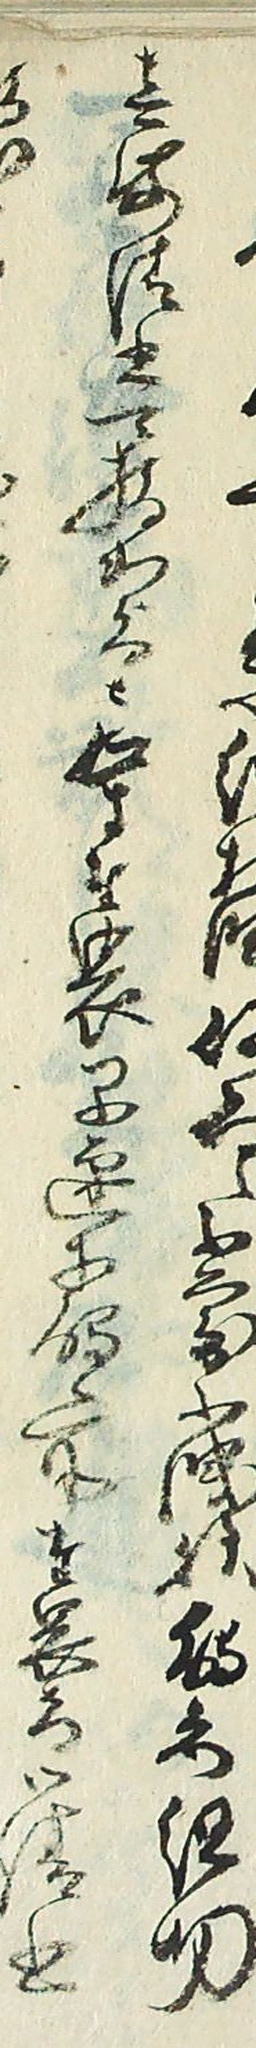壱紙請書可指出旨被仰付奉畏早速相触候所奉畏旨御請書
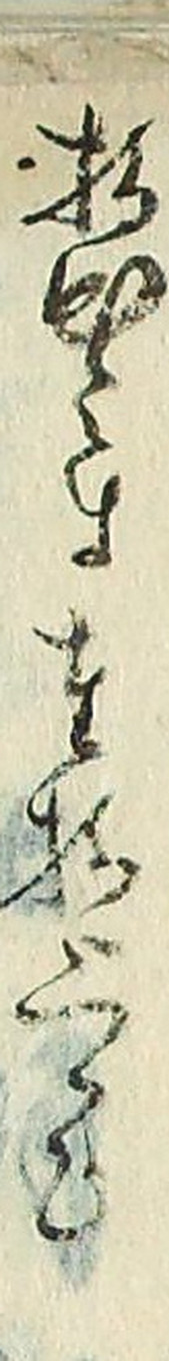指出候に付奉指上候以上

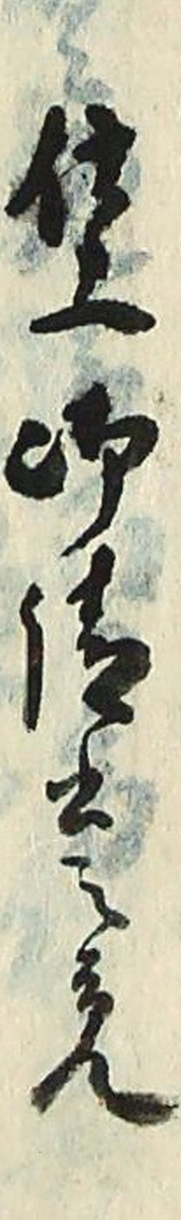仕上御請書之覚
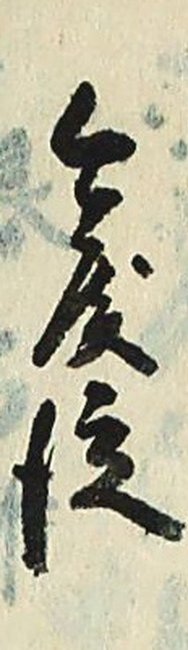今度従
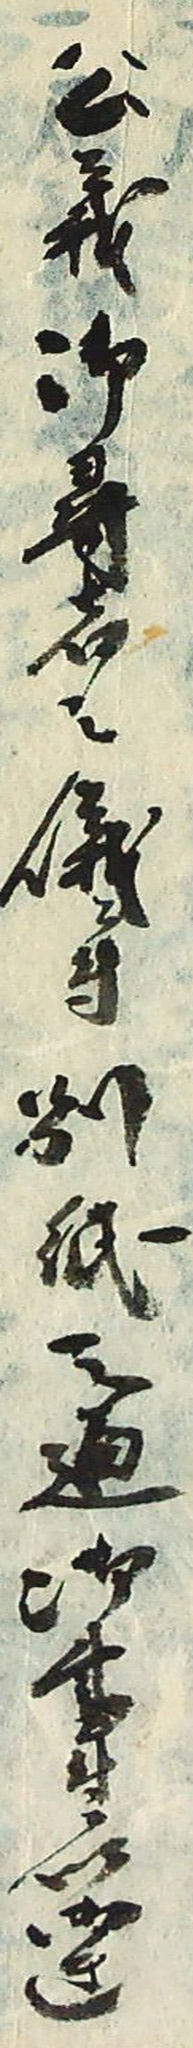公義御尋者之儀に付別紙之通御書付を以御達
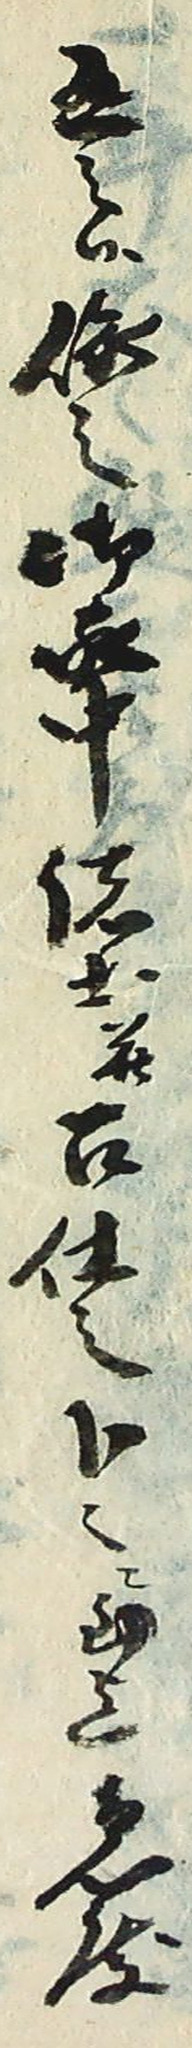有之候依之御家中諸士幷召仕之下々に至迄急度
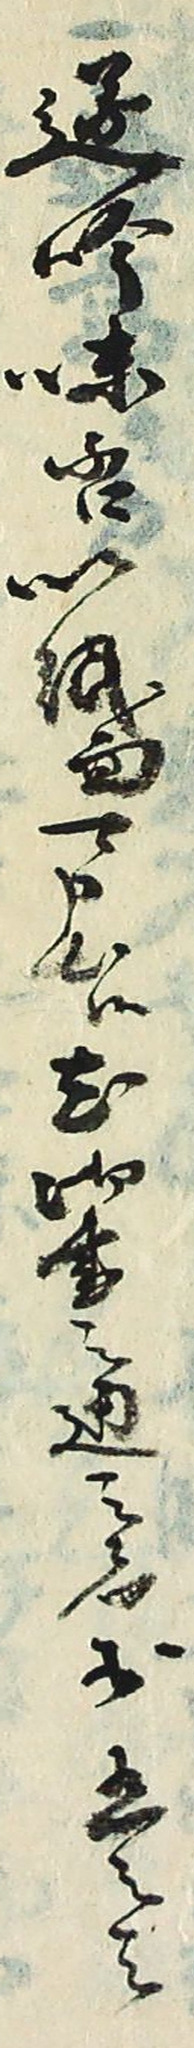遂吟味否以紙面可申出候尤御書之通之者於有之は
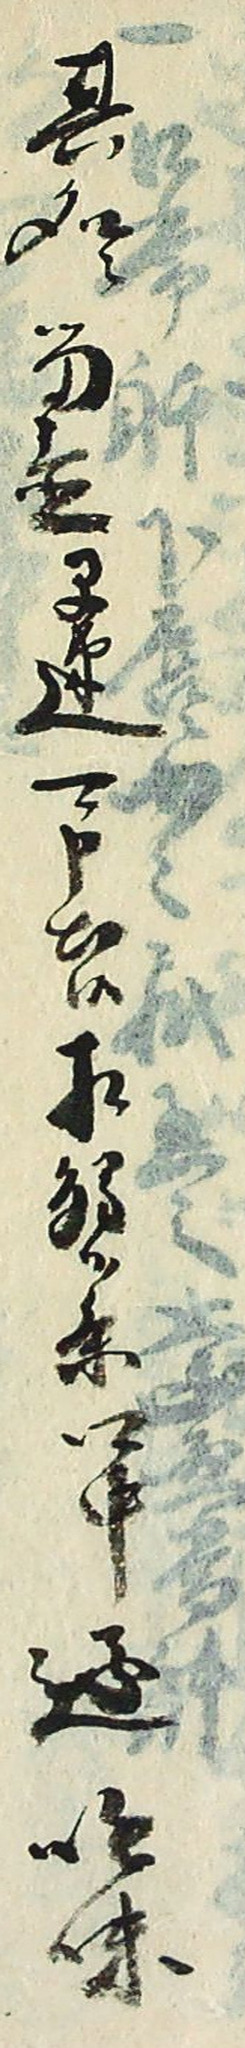其処に留置早速可申出候相触候条郷中遂吟味
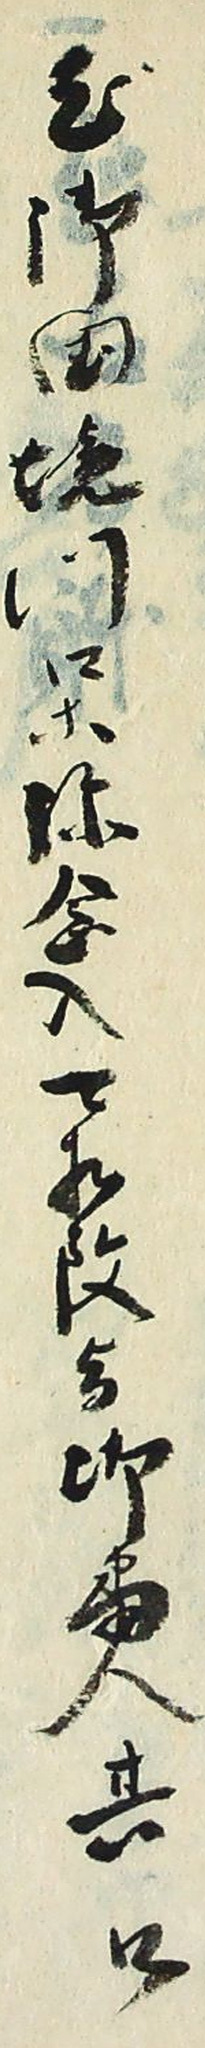尤御国境川口等弥念入可相改旨御番人共江
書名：諸御用御□受書控
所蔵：鳴門教育大学 Naruto University of Education
